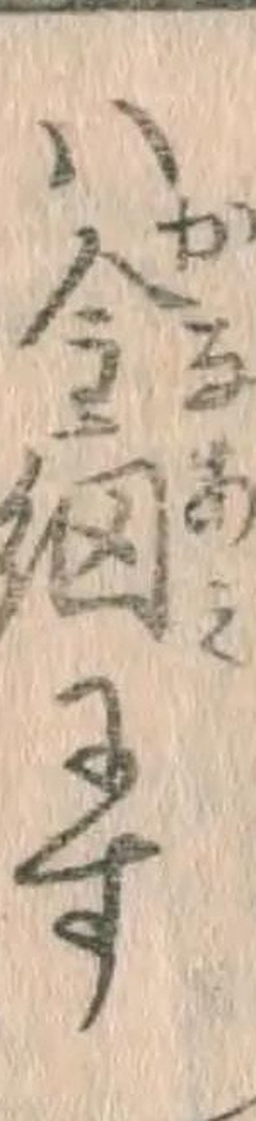は金網にす
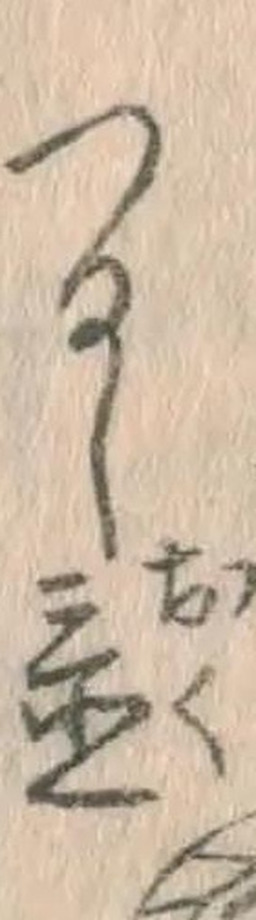つるし置
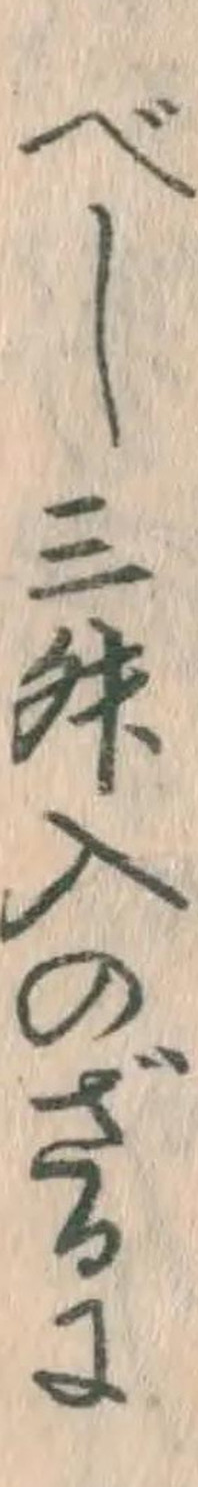べし三升入のざるに
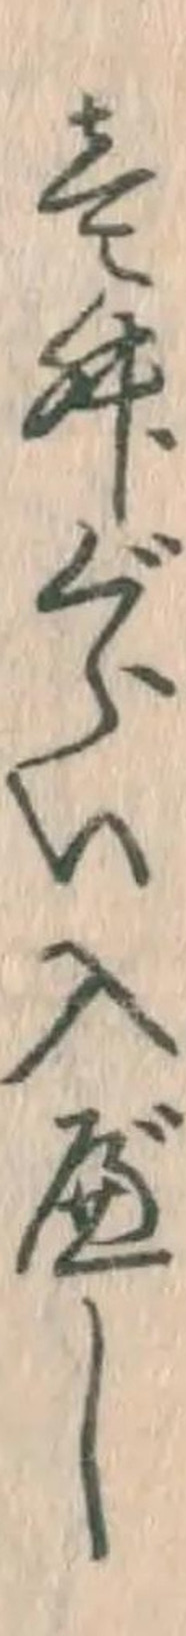壱升ぐらい入べし

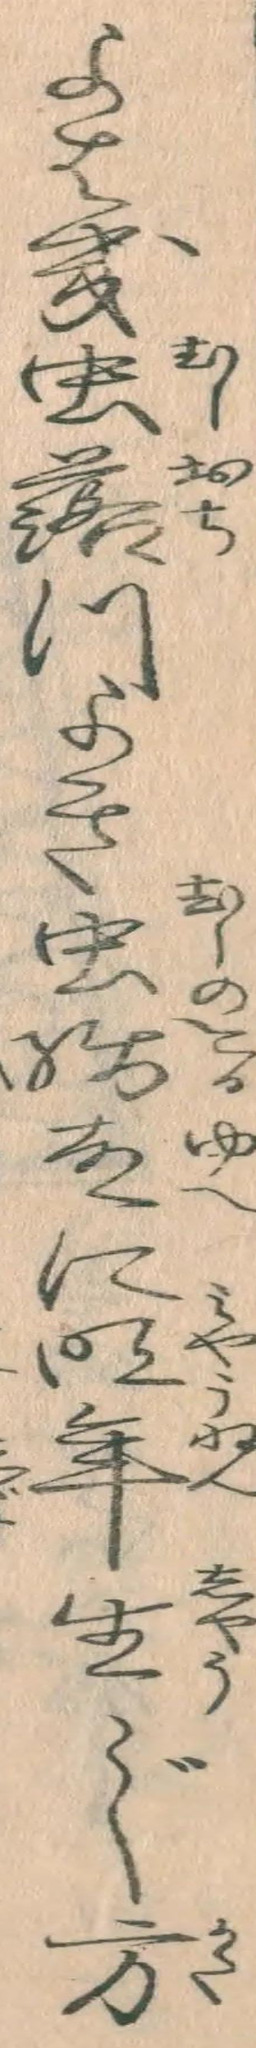よはき虫落つよき虫残故に明年生じ方
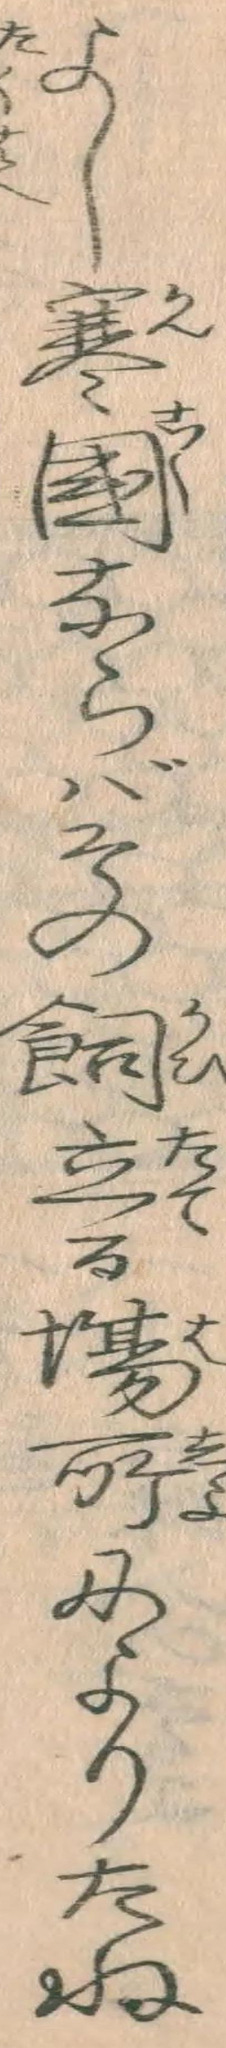よし寒国ならばその飼立る場所によりたね
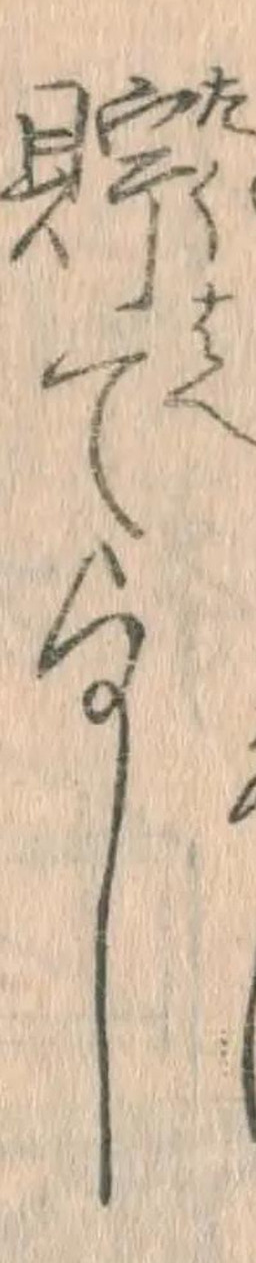貯てよし
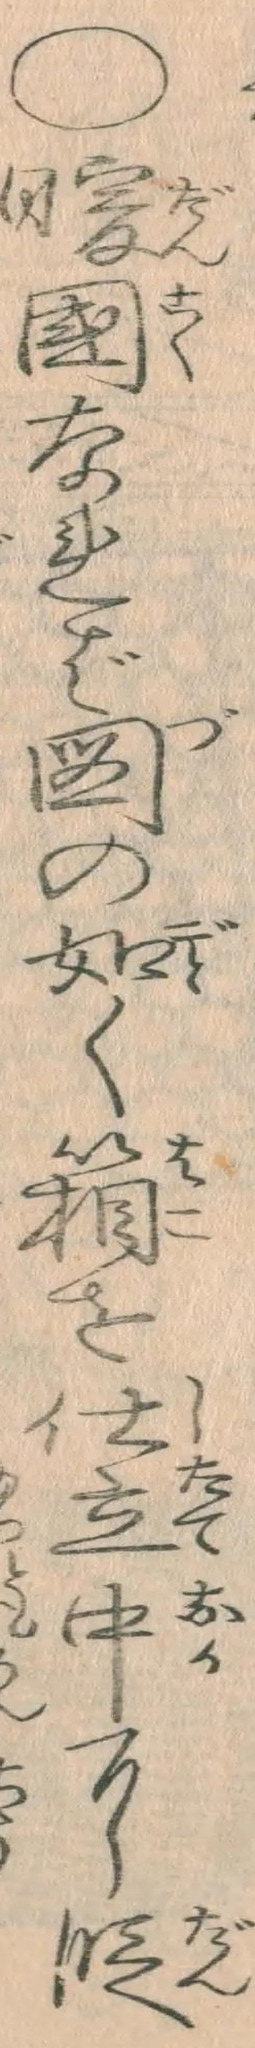○暖国なれば図の如く箱を仕立中に段
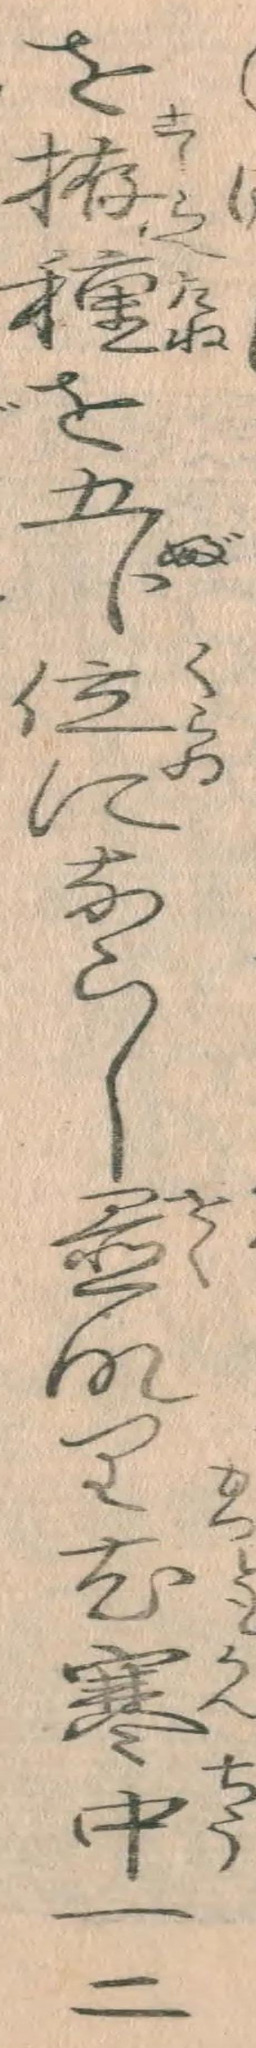を拵種を五分位にならし置なり尤寒中一二
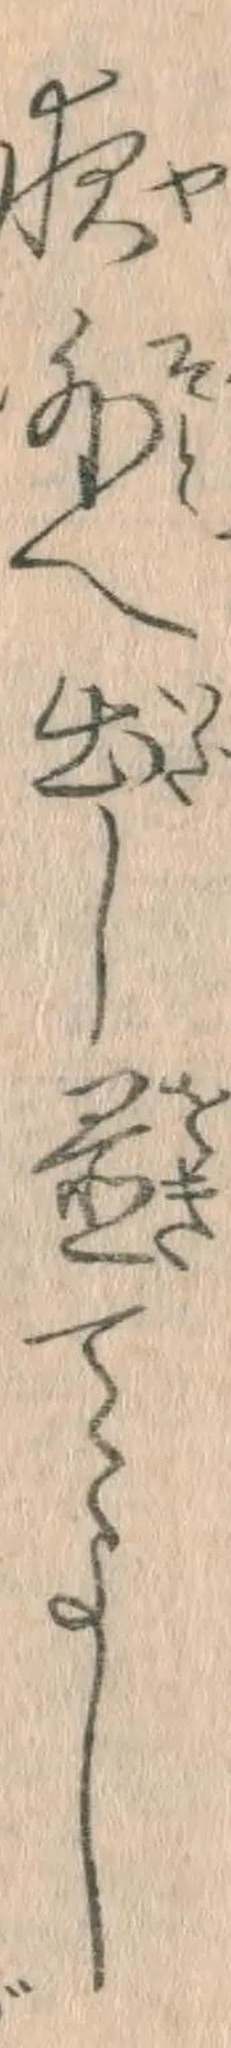夜外へ出し置てよし
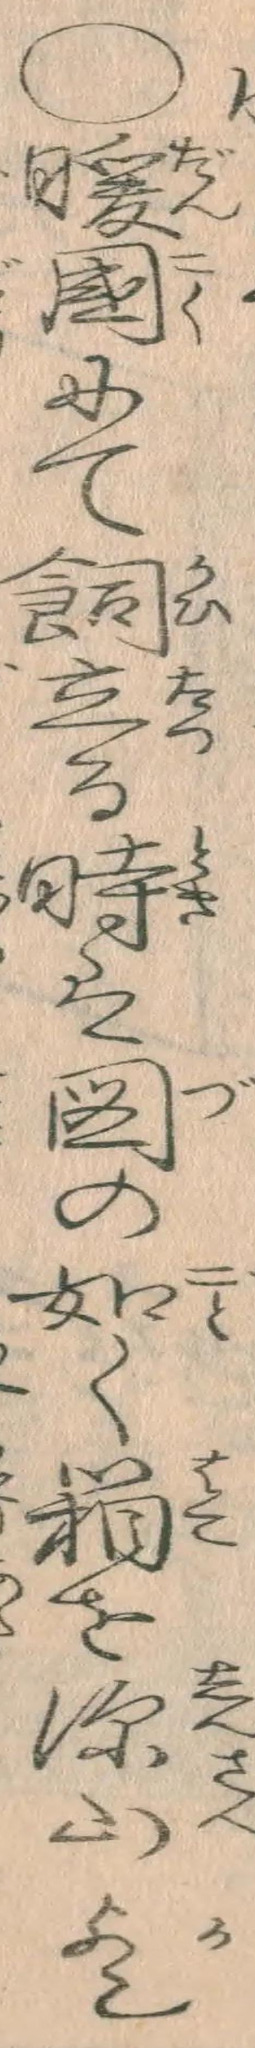○暖国にて飼立る時は図の如く箱を深山歟
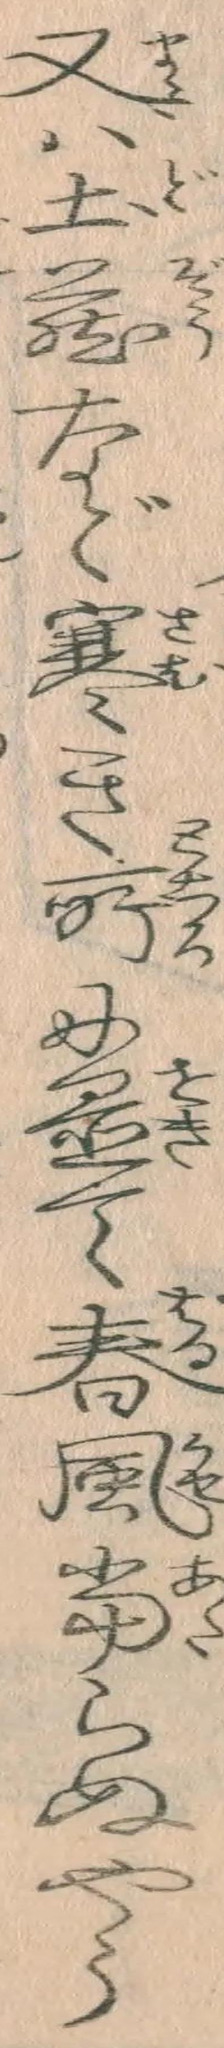又は土蔵など寒き所に置て春風当らぬやう
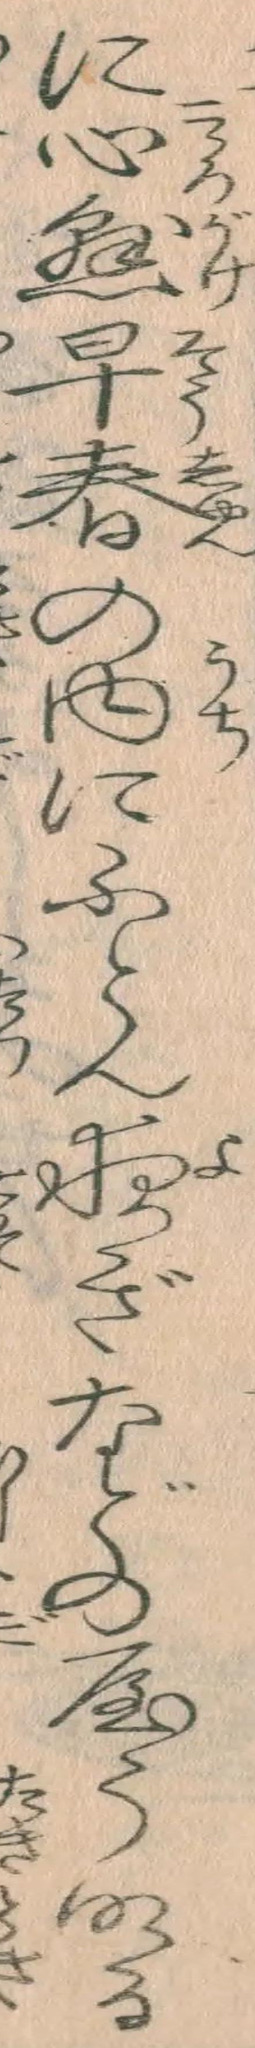に心懸早春の内にふとん夜ぎなどのやうなる
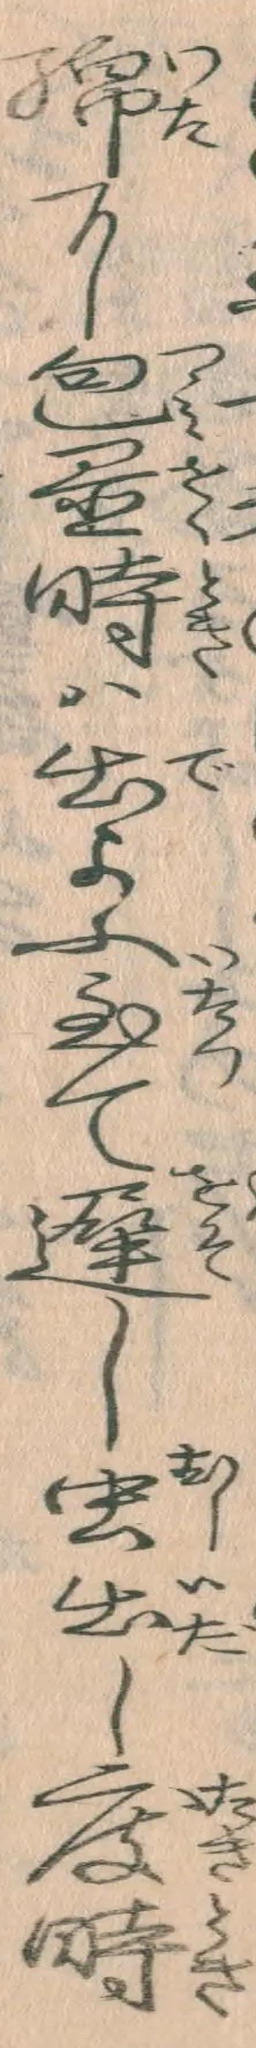綿に包置時は出よふ至て遅し虫出し度時
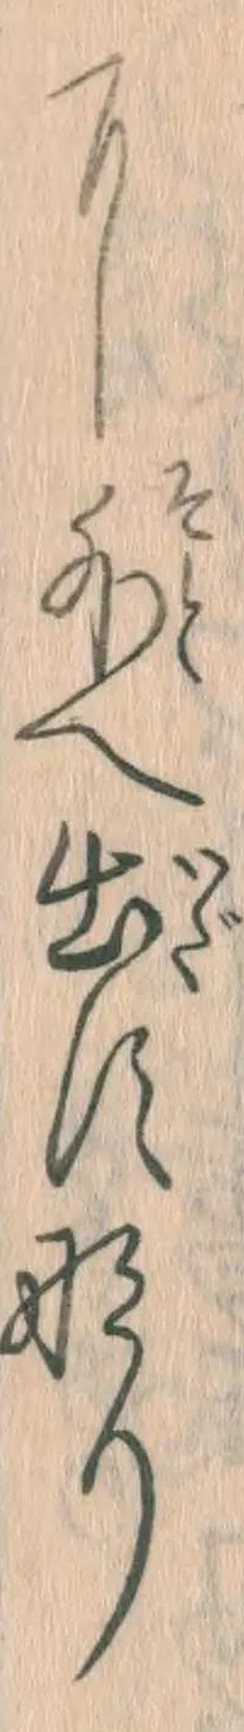に外へ出すなり
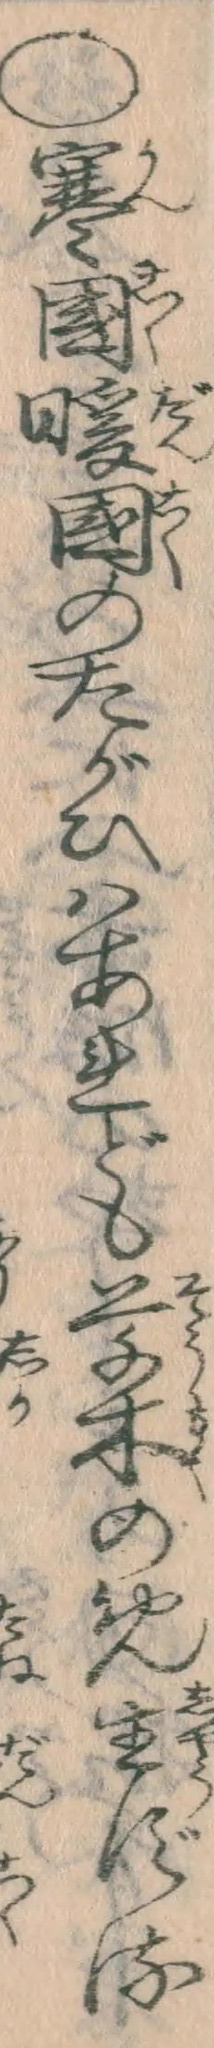○寒国暖国のたがひはあれども草木のめ生ずる
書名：山繭養法秘傳抄
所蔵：国立国会図書館 National Diet Library, JAPAN
